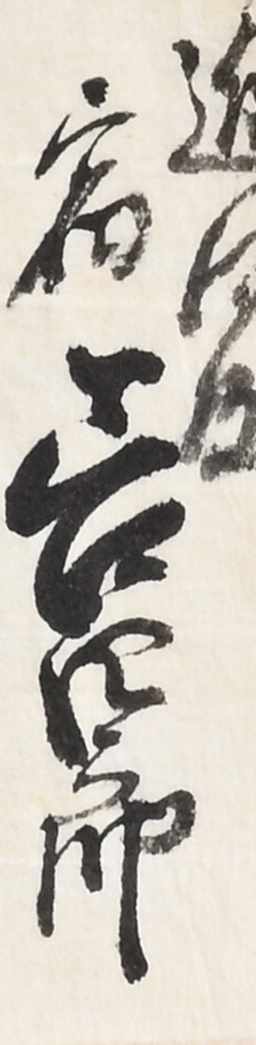宿善四郎
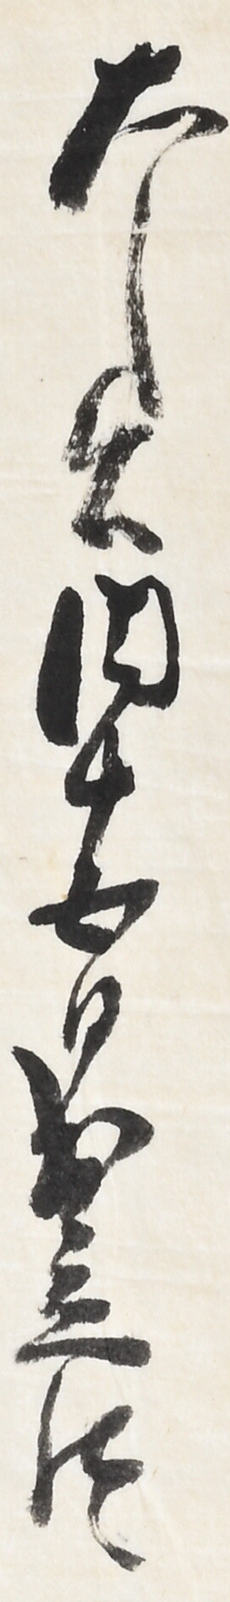右之者同十七日出立仕候
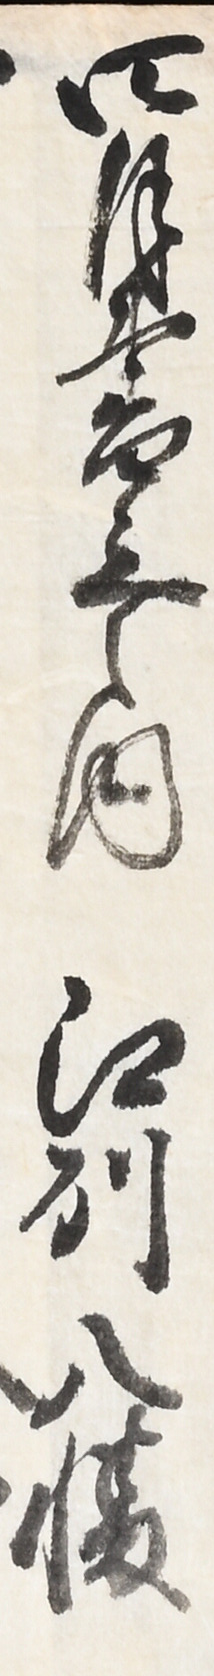四月書上之内江州八幡
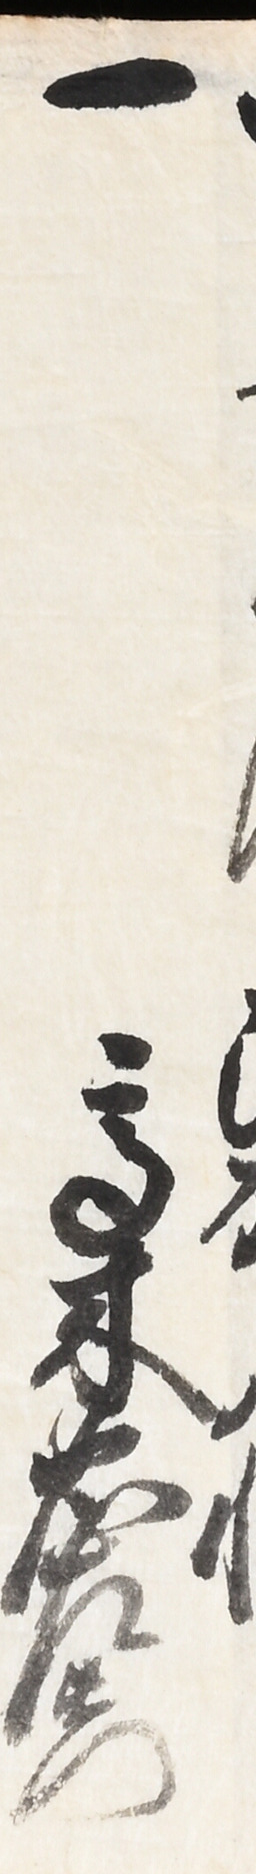一高木忠左衛門
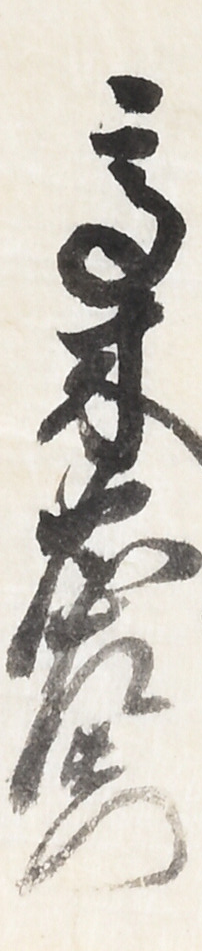一高木忠左衛門
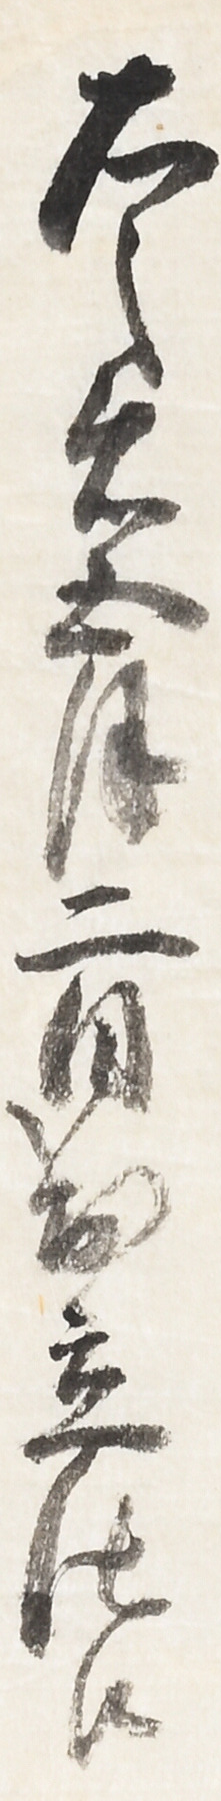右之者五月二日出立仕候
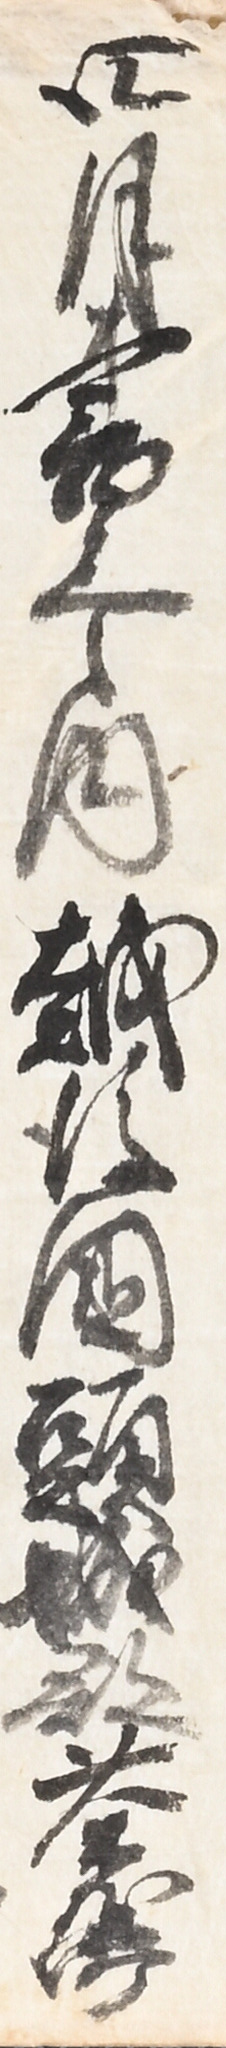四月書上之内越後国頸城郡茶屋町
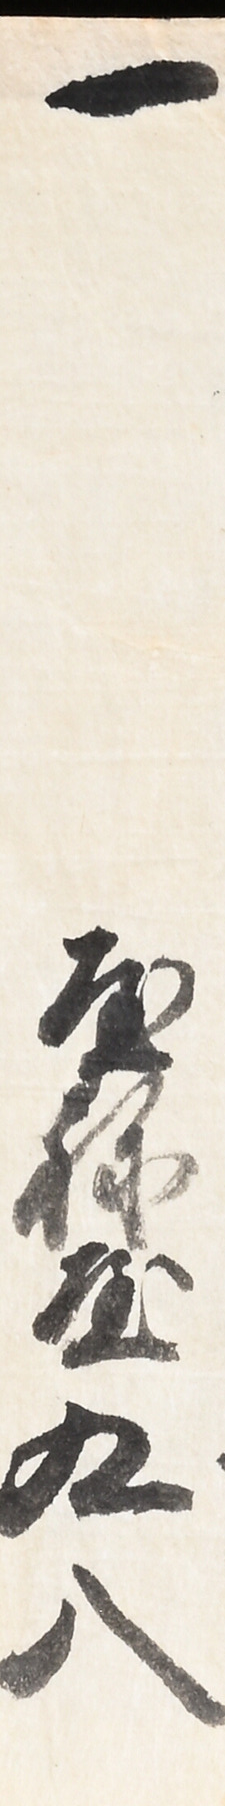一屋祢屋九八
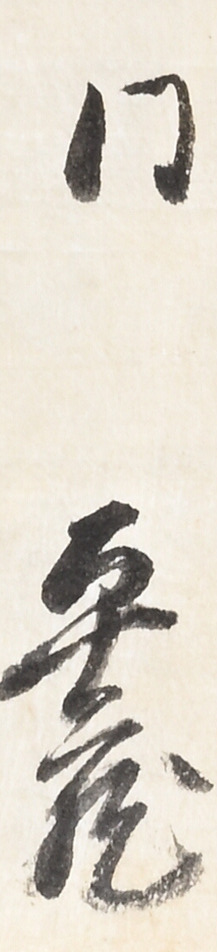同平蔵
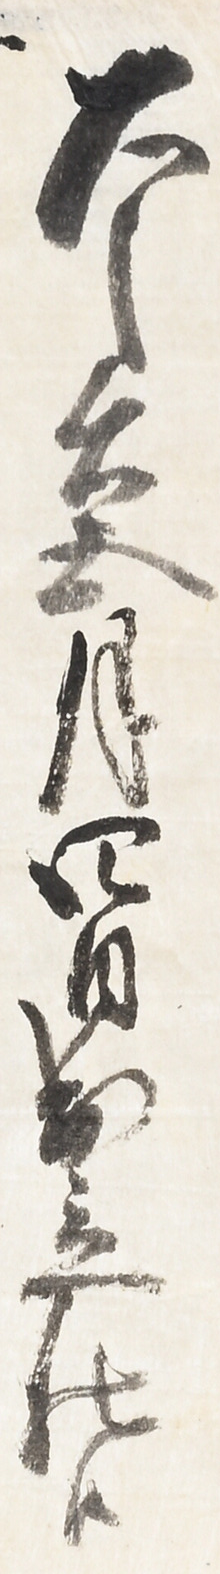右之者五月四日出立仕候
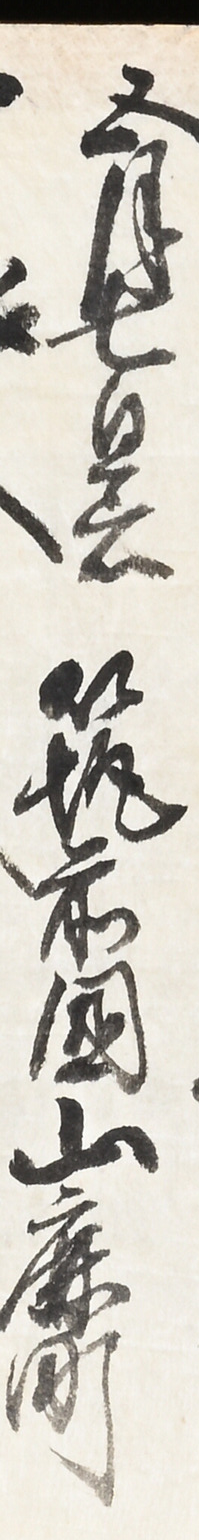五月七日着筑前国山鹿町
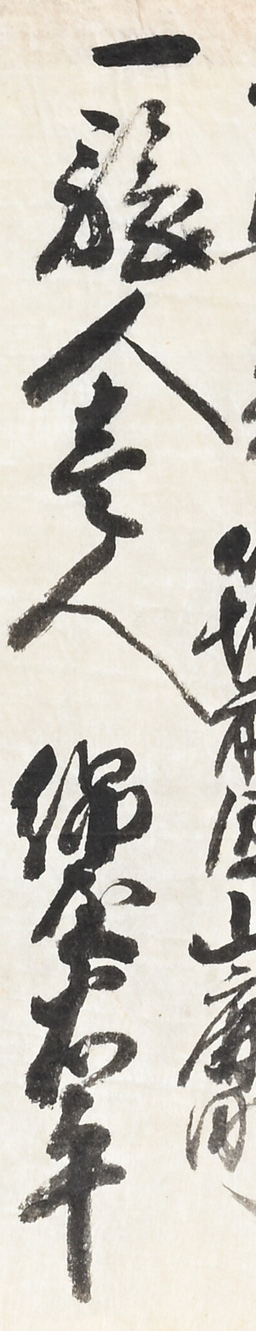一旅人壱人綿屋忠平
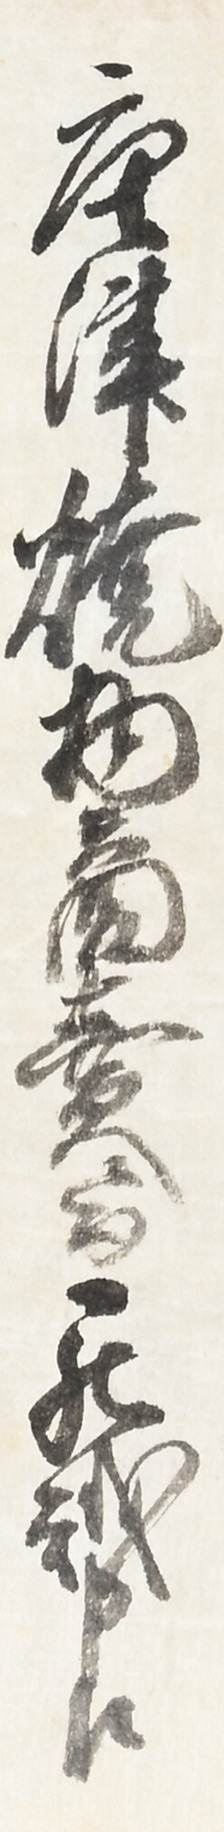唐津焼き物商売ニ而罷越申候
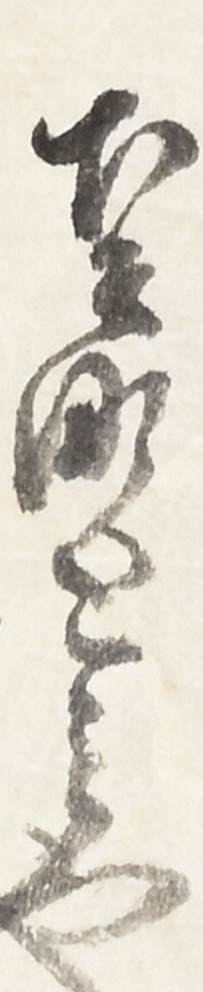下モ町とみや
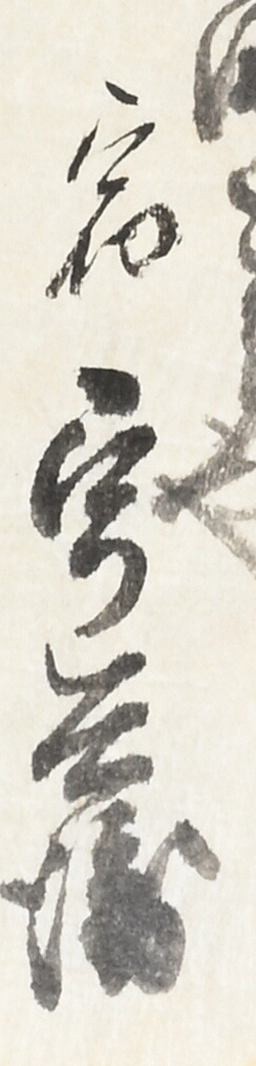宿宇兵衛
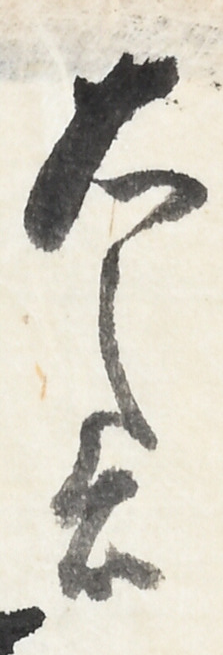右之者
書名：旅人泊控帳
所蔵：伊那市立高遠町図書館・合同会社AMANE
